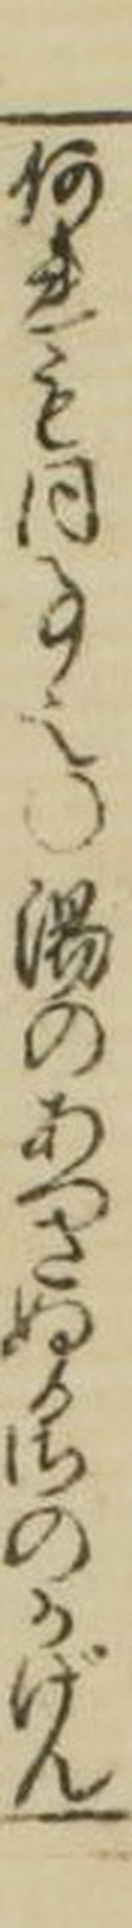何れも同事也○湯のあつさぬるさのかげん
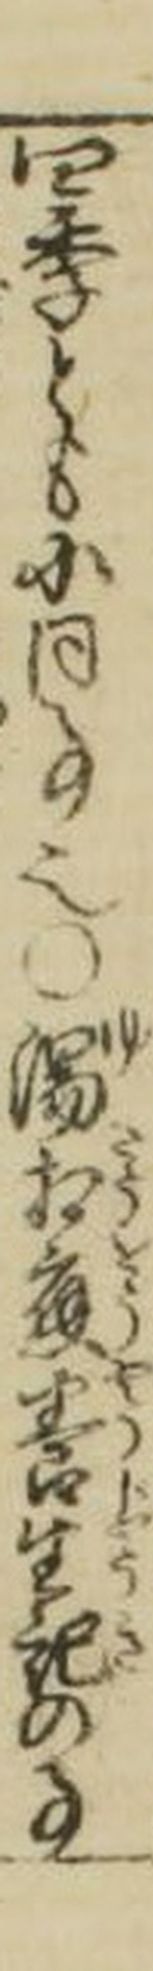四季ともに同事也○湯相應養生記の事
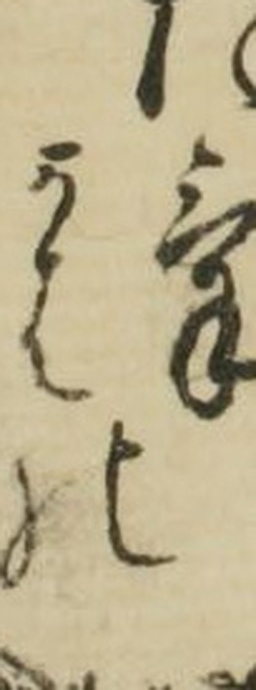かはの
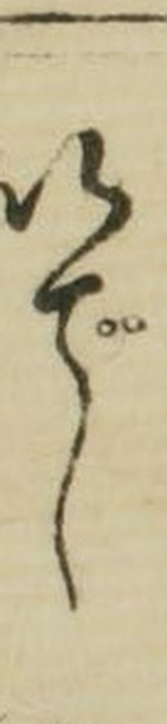いでし
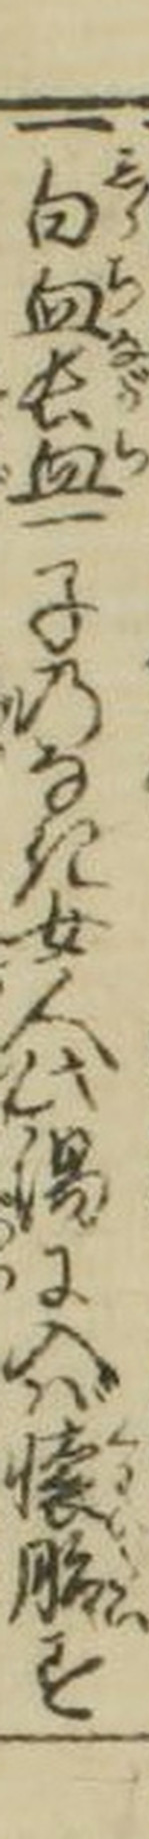一白血長血一子のなき女人此湯に入ば懐胎す
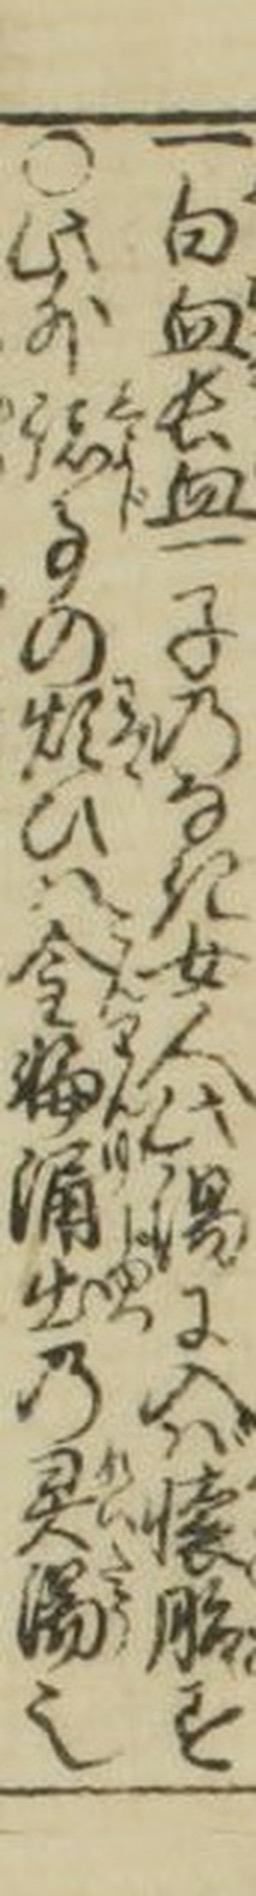○此外諸事の煩ひは金輪涌出の霊湯也
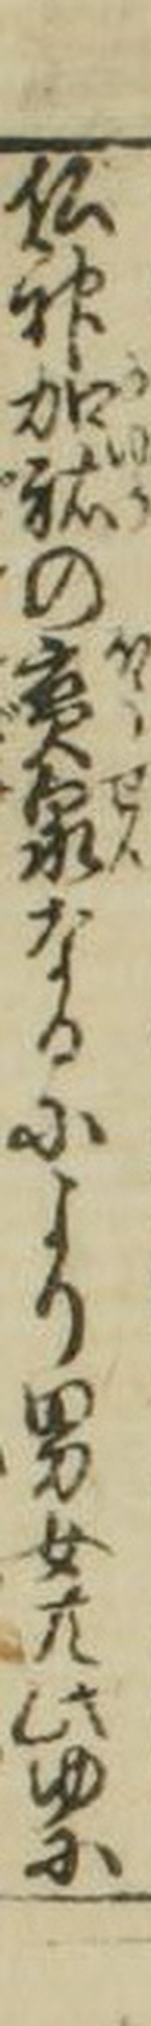仏神加祐の寶泉なるにより男女共此ゆに
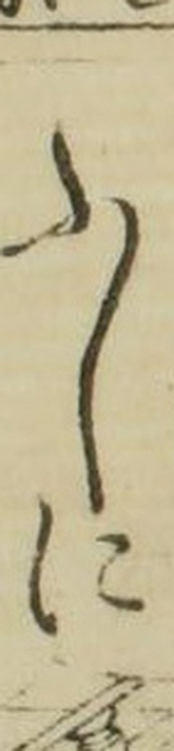ふしに
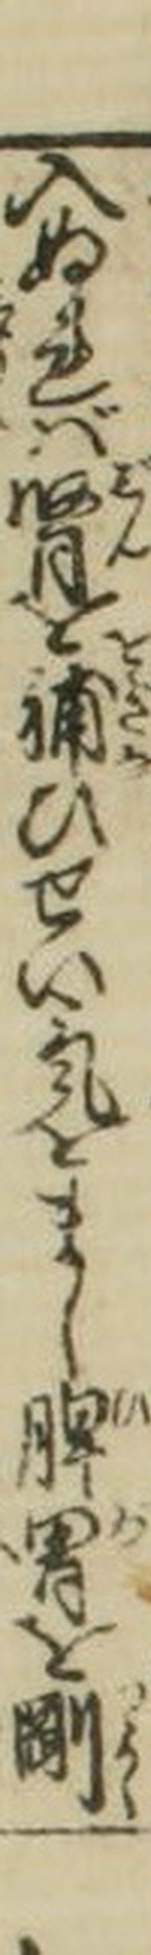入ぬれば腎を補ひせい気をまし脾胃を剛
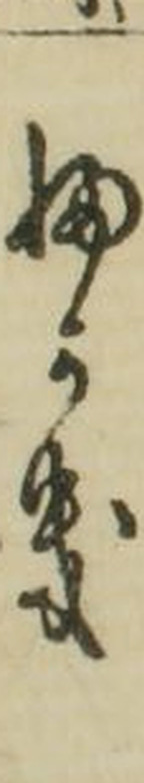ふかき
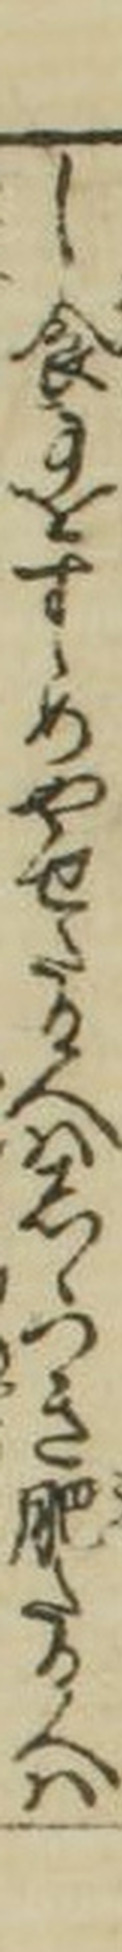し食事をすゝめやせたる人はしゝつき肥たる人は
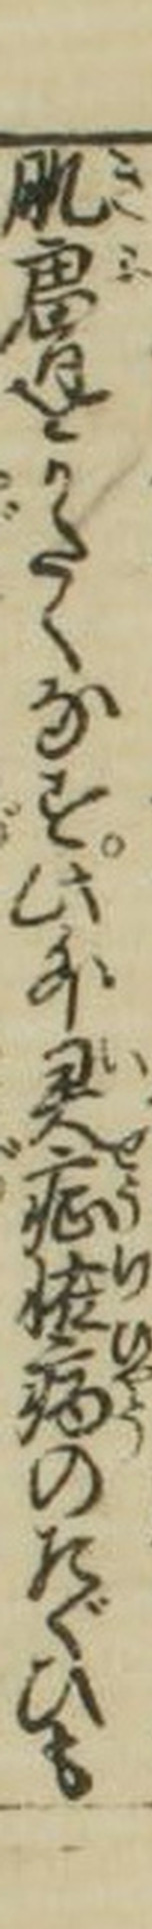肌膚をかたくなす。此外異症怪病のたぐひも
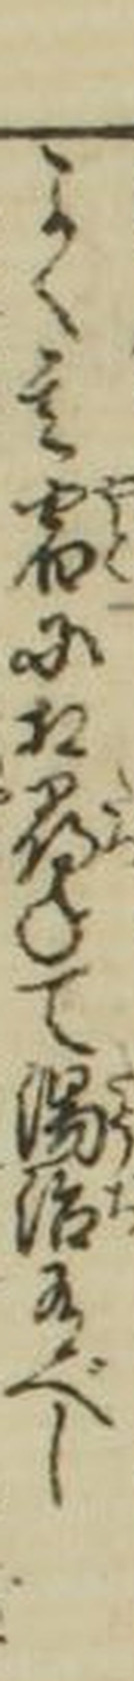よく其宿に相尋ねて湯治有べし
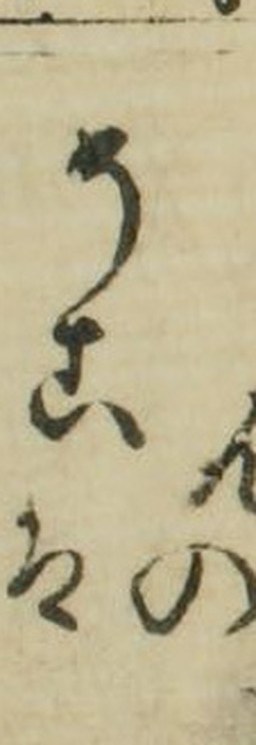そこは
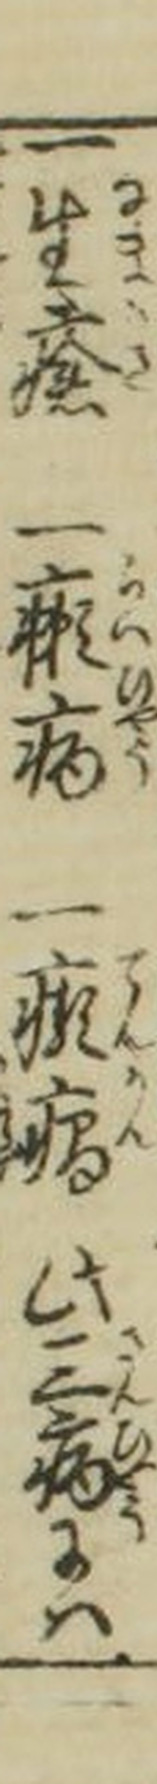一生瘡一癩病一癲癇此三病には
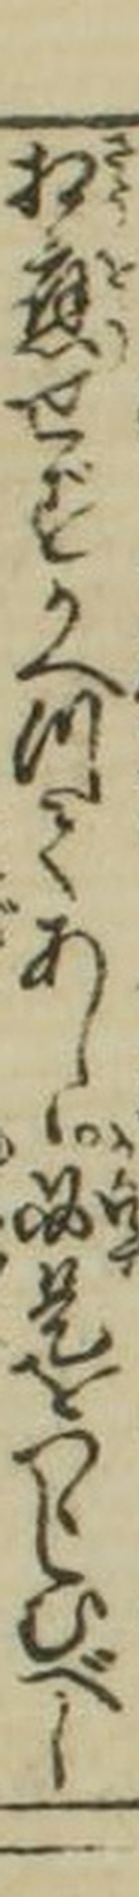相應せずかへつてあしゝ。必是をつゝしむべし
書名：女源氏教訓鑑
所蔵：東京学芸大学附属図書館
